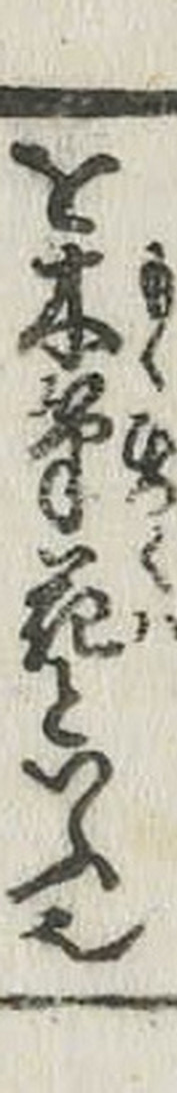を木筆花といふ也
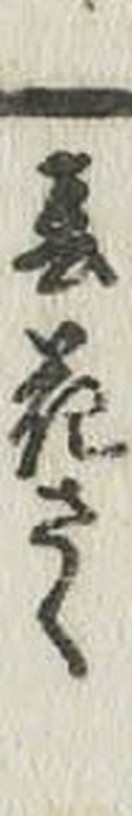春花さく
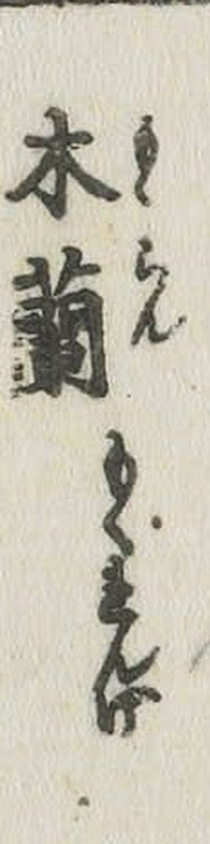木蘭もくれんげ
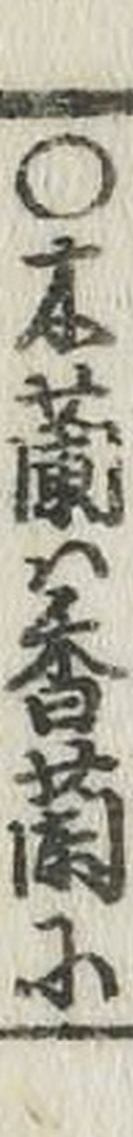○木蘭は香蘭に
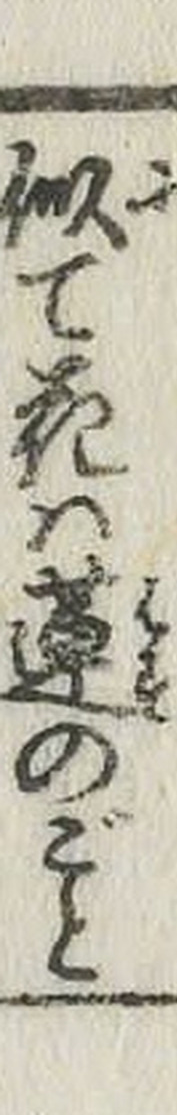似て花は蓮のごと
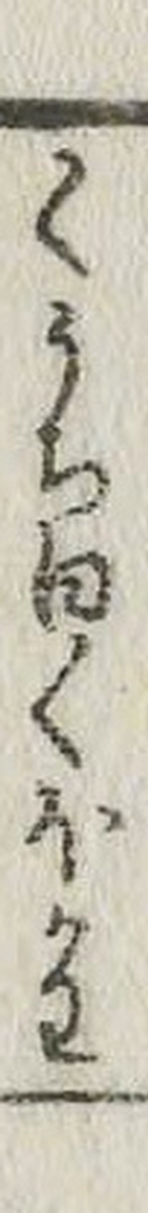くうち白く外かわ
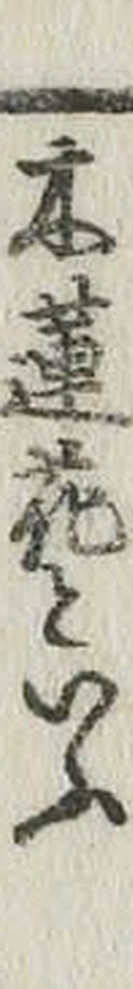木蓮花といふ
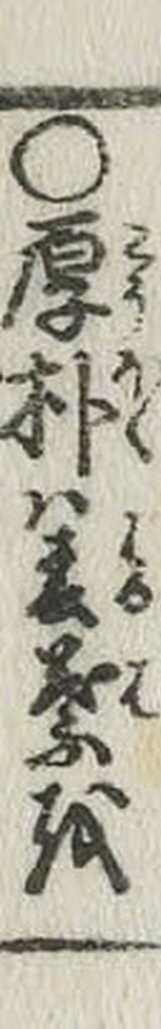○厚朴は春葉を
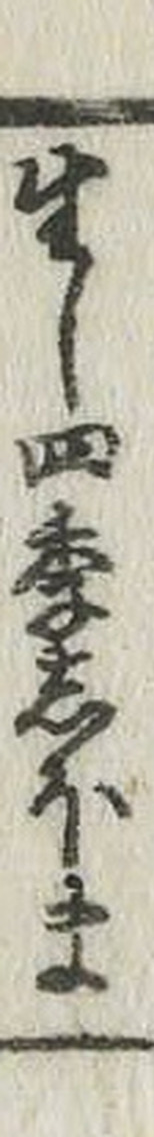生し四季しほま
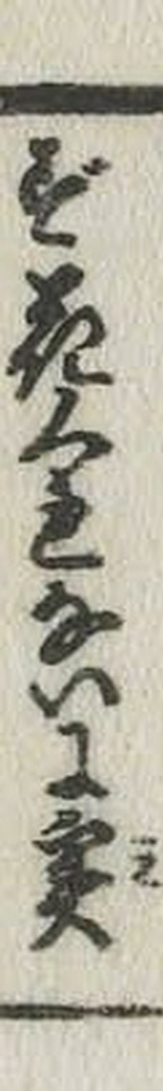ず花くれないに実
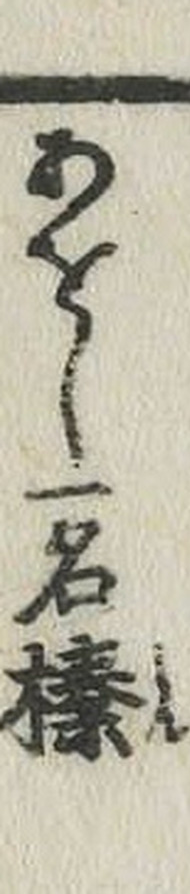あをし一名榛

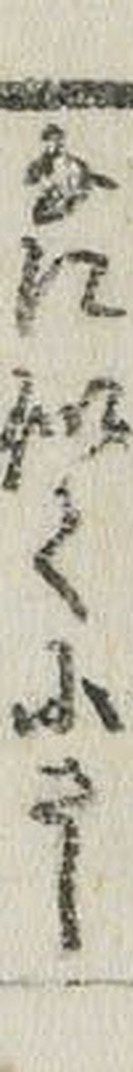なに似て小さし
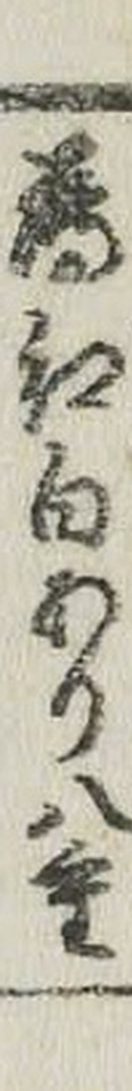薄紅白あり八重
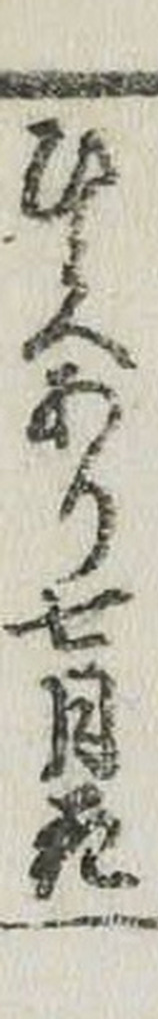ひとへあり七月花
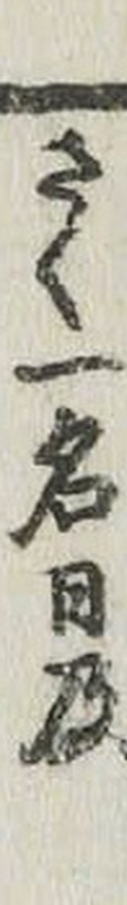さく一名日及
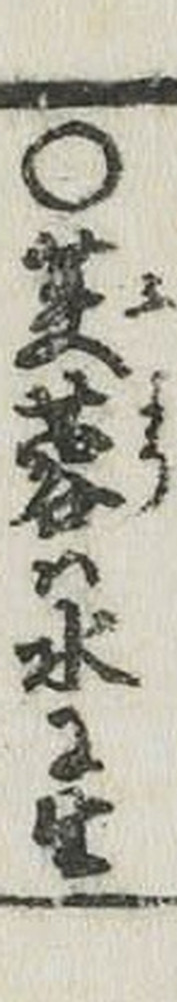○芙蓉は水に生
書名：増補頭書訓蒙図彙大成 10巻 8:巻之17-19
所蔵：東京学芸大学教育コンテンツアーカイブ
